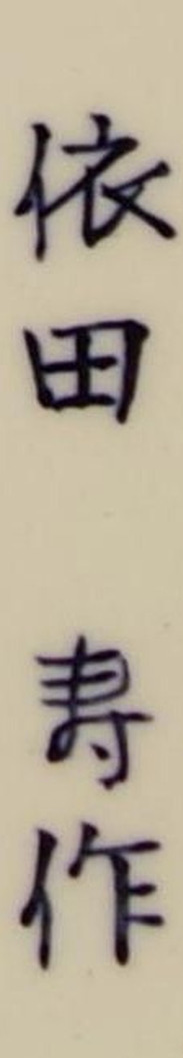依田寿作
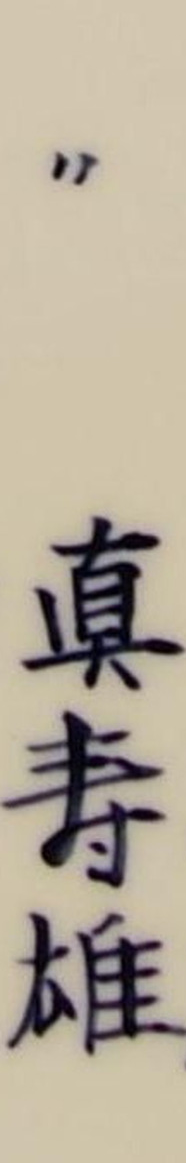真寿雄
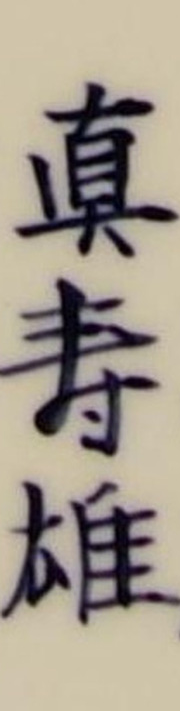真寿雄
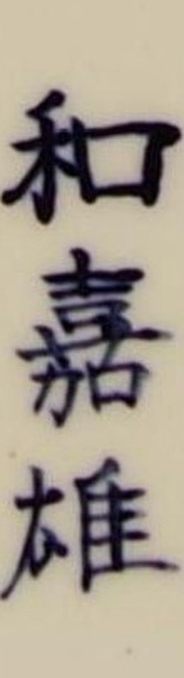和嘉雄
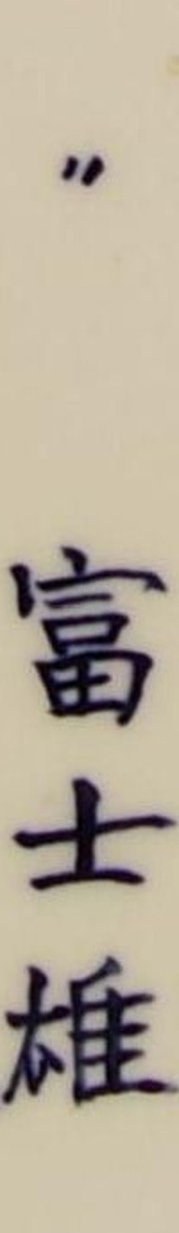富士雄
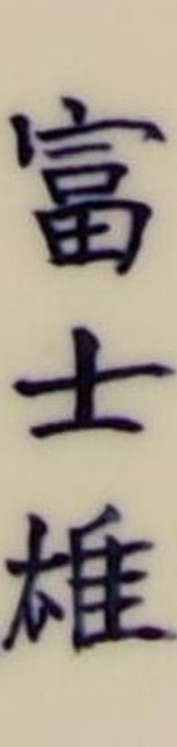富士雄
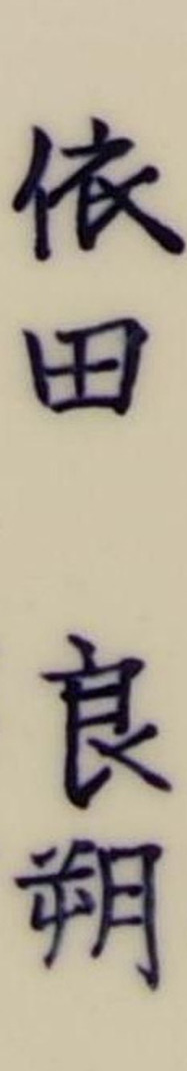依田良朔
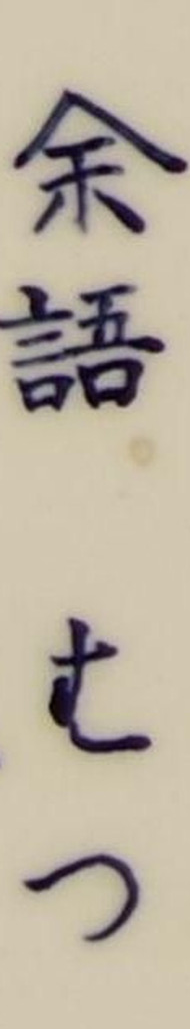余語はつ
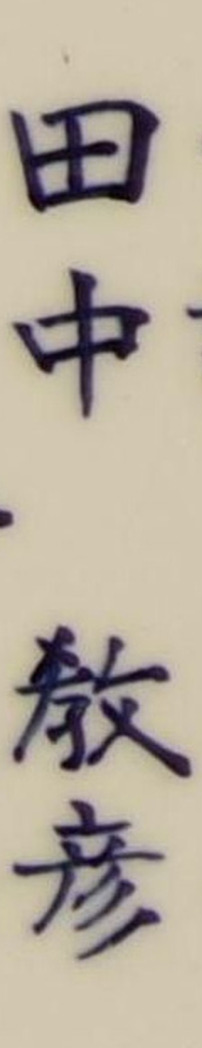田中教彦
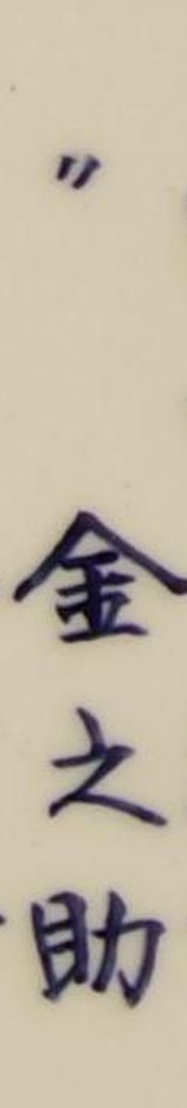金之助
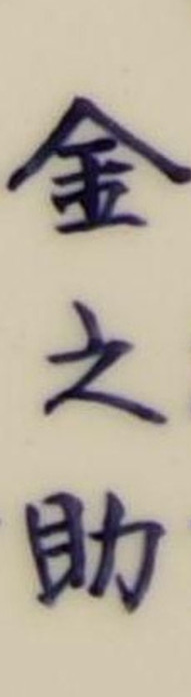金之助
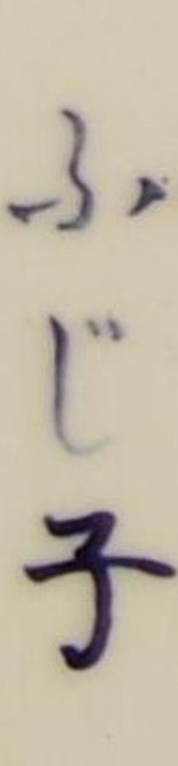ふじ子

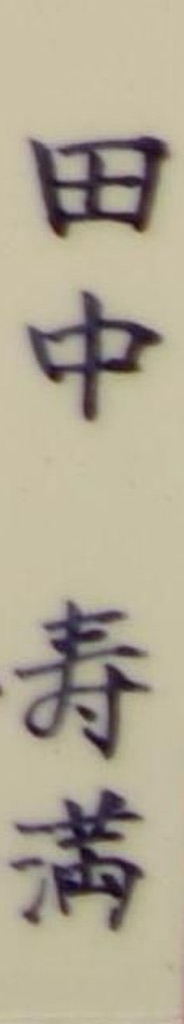田中寿満
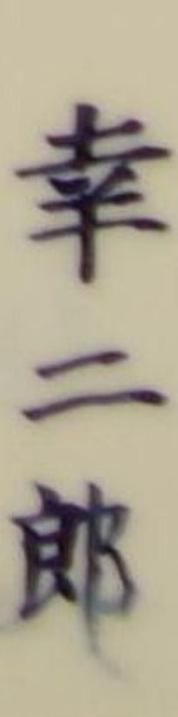幸二郎
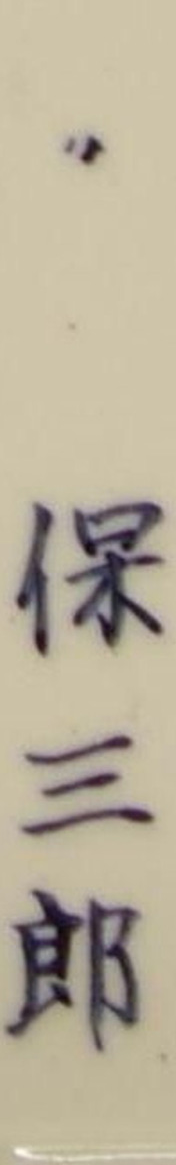保三郎
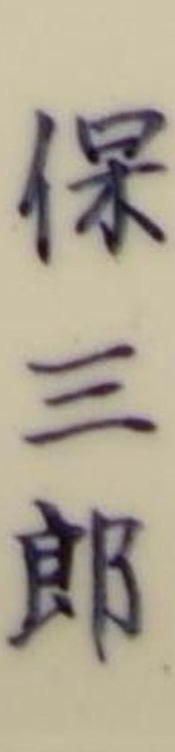保三郎
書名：A~D
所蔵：koyasan kongobuji
